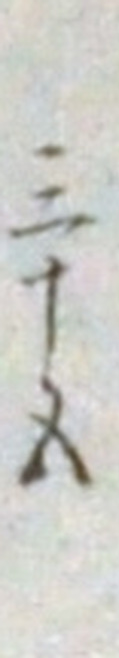三十五
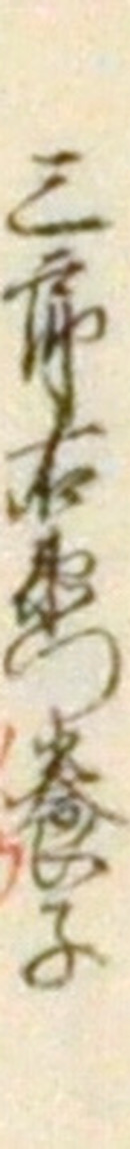三郎右衛門養子
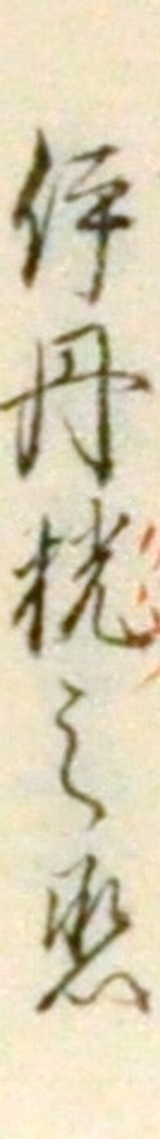伊丹桄之丞
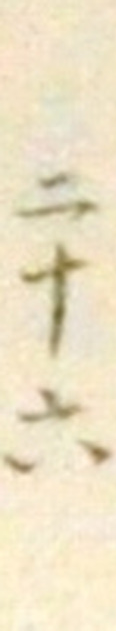二十六

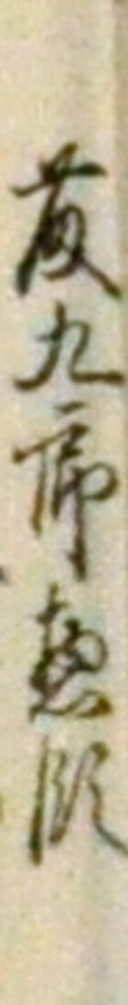籐九郎惣領
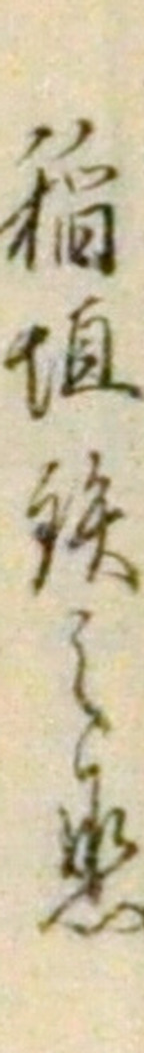稲垣鉄之丞
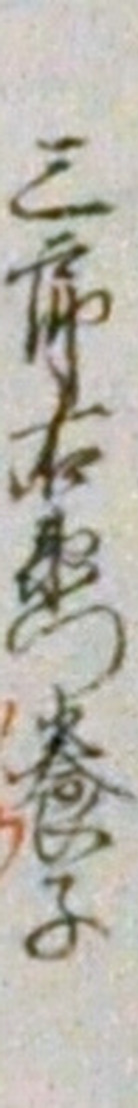三郎右衛門養子
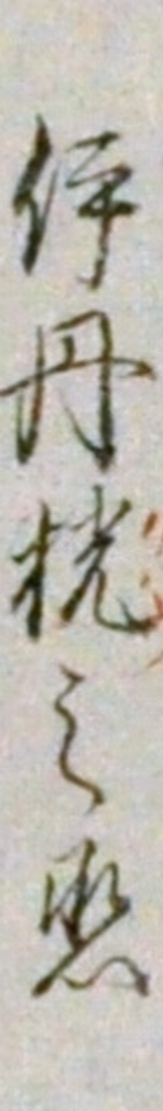伊丹桄之丞
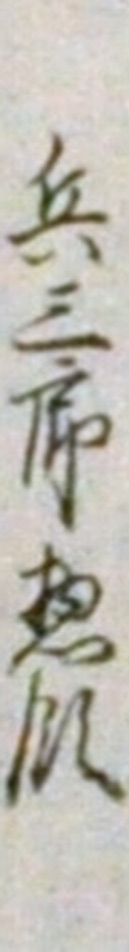兵三郎惣領
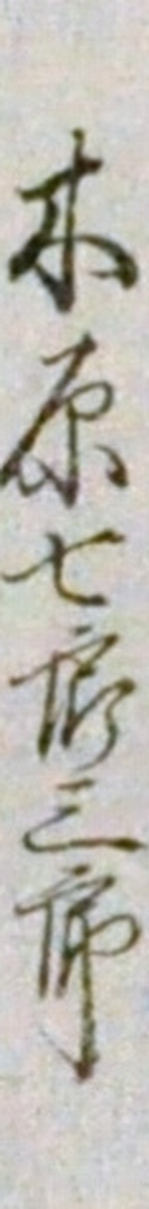木原七郎三郎
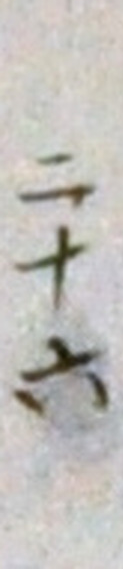二十六
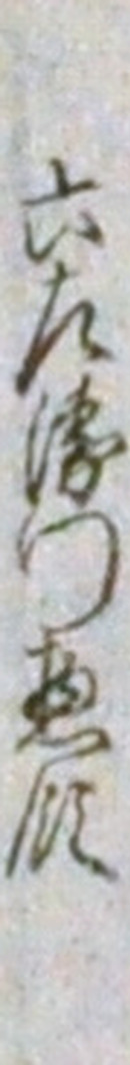六左衛門惣領
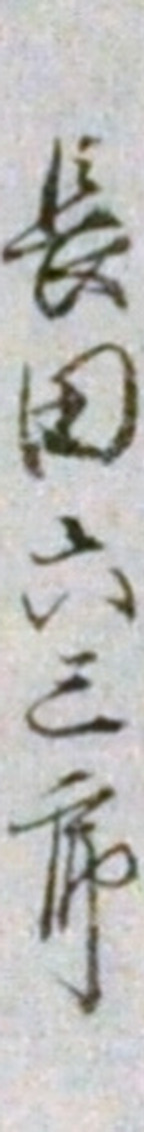長田六三郎
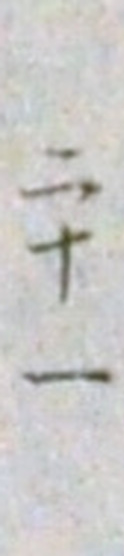二十一
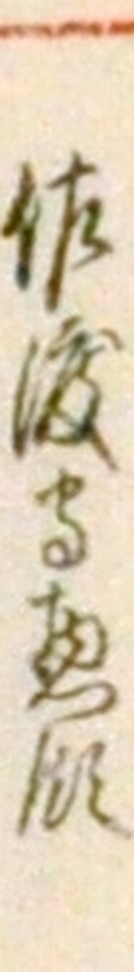佐渡守惣領
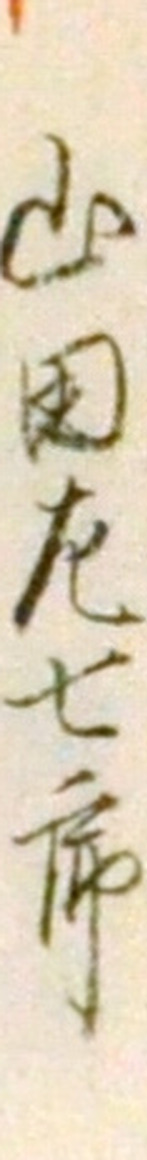山田左七郎
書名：若年寄御役中之御書物〔一括〕
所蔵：伊那市立高遠町図書館・合同会社AMANE
